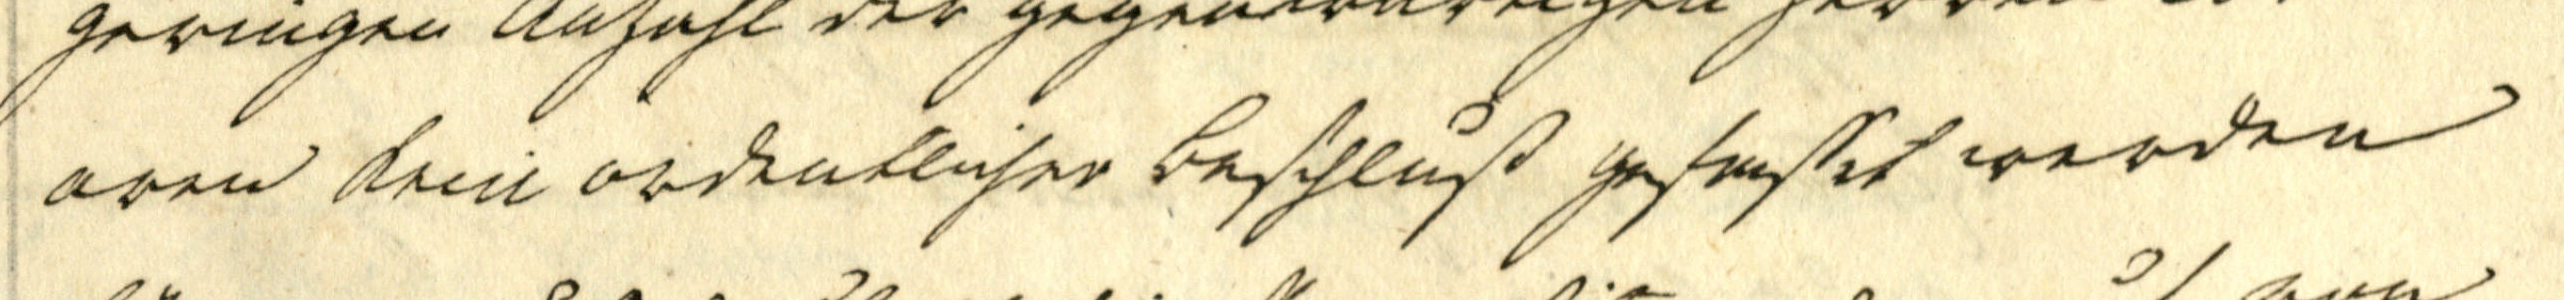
aren kein ordentlicher Beschluß gefasset werden
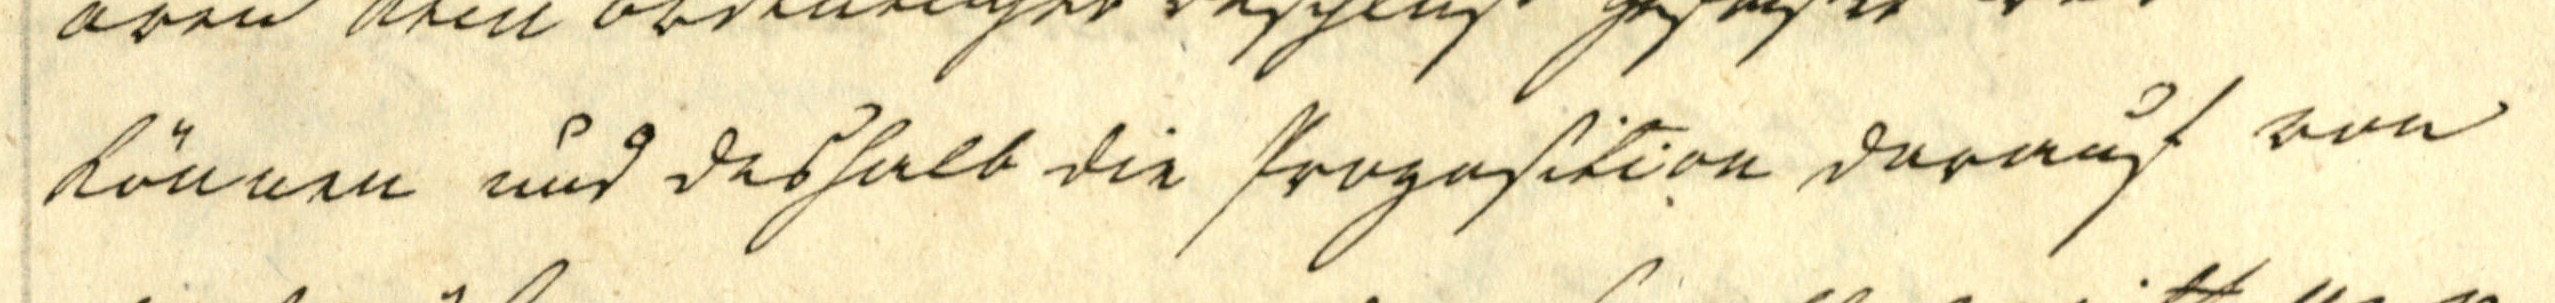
können und deshalb die Proposition darauf von
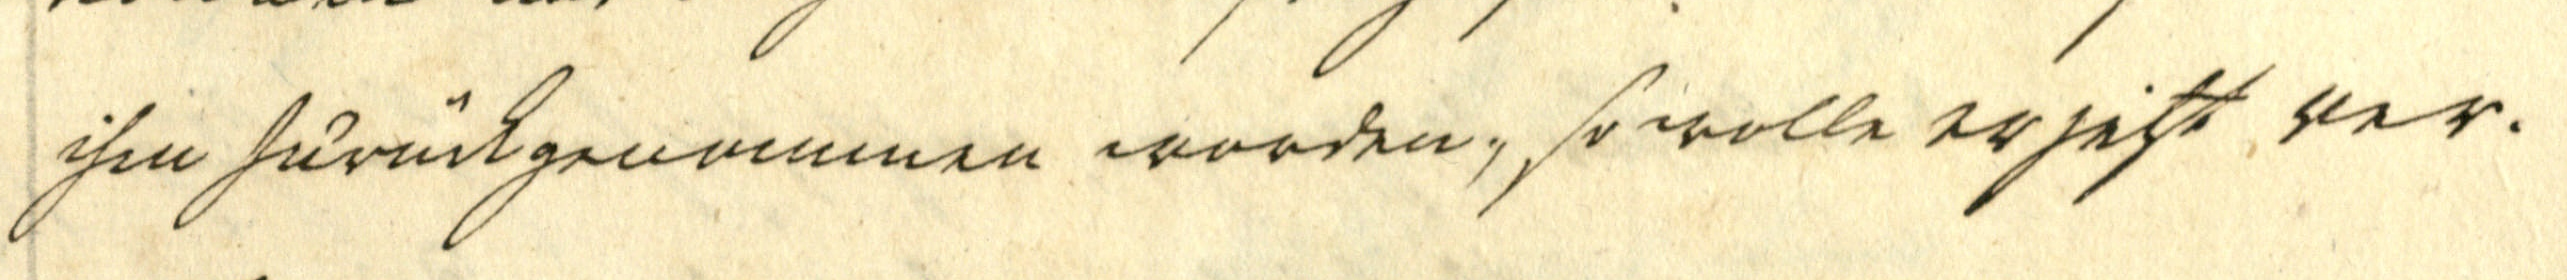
ihm zurückgenommen worden; so wolle er jetzt ver¬
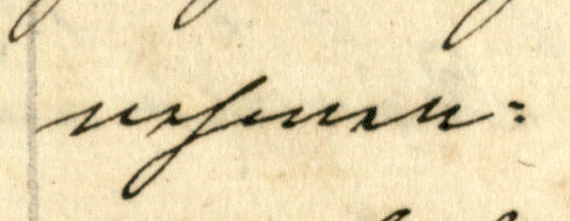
nehmen:
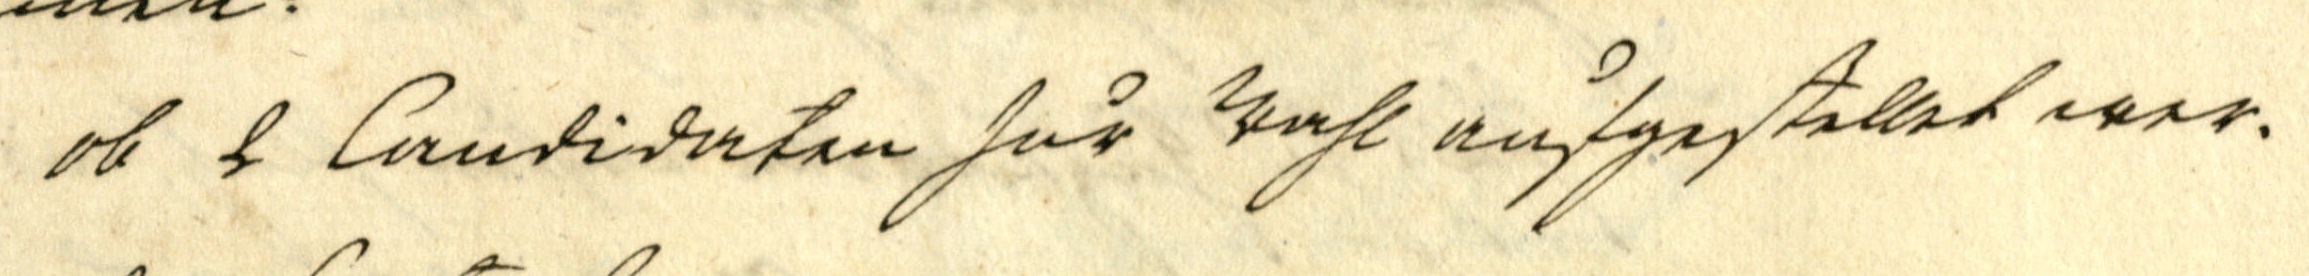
ob 2 Candidaten zur Wahl ausgestellet wer¬
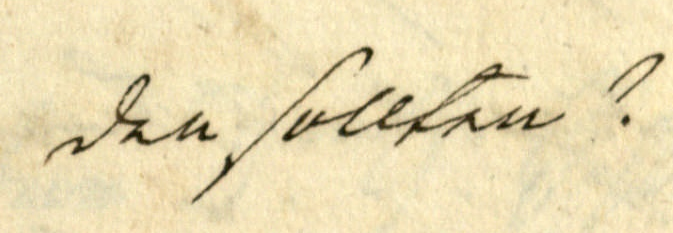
den sollten?
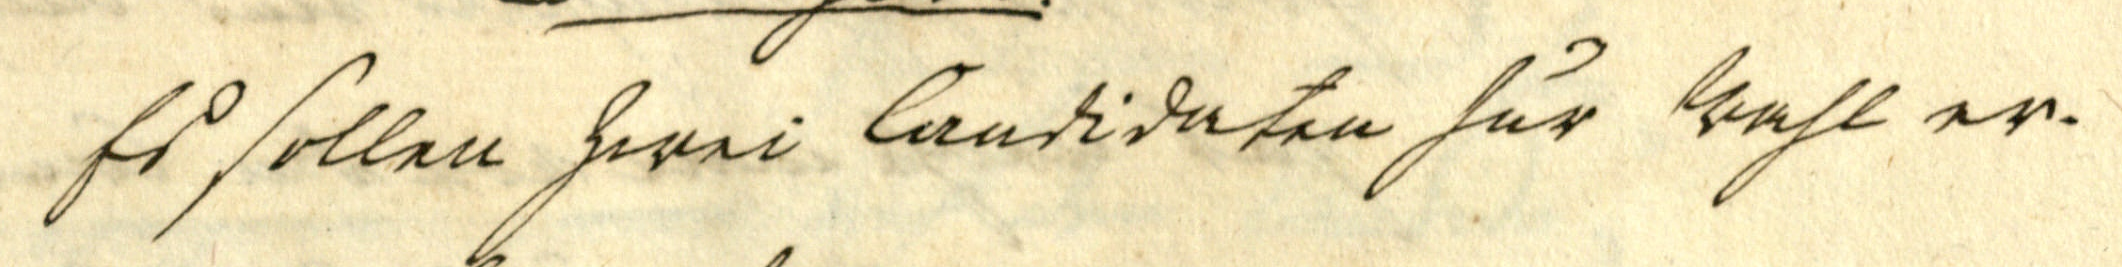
Es sollen zwei Candidaten zur Wahl er¬
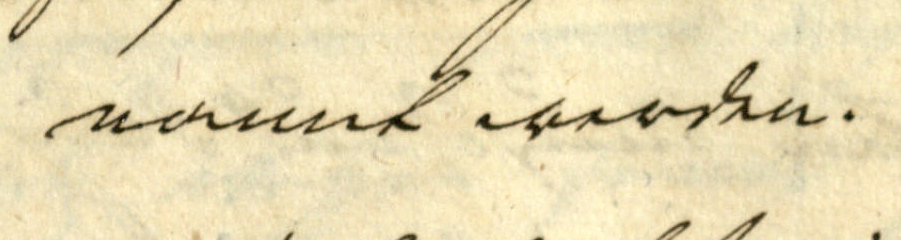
nanntt werden.
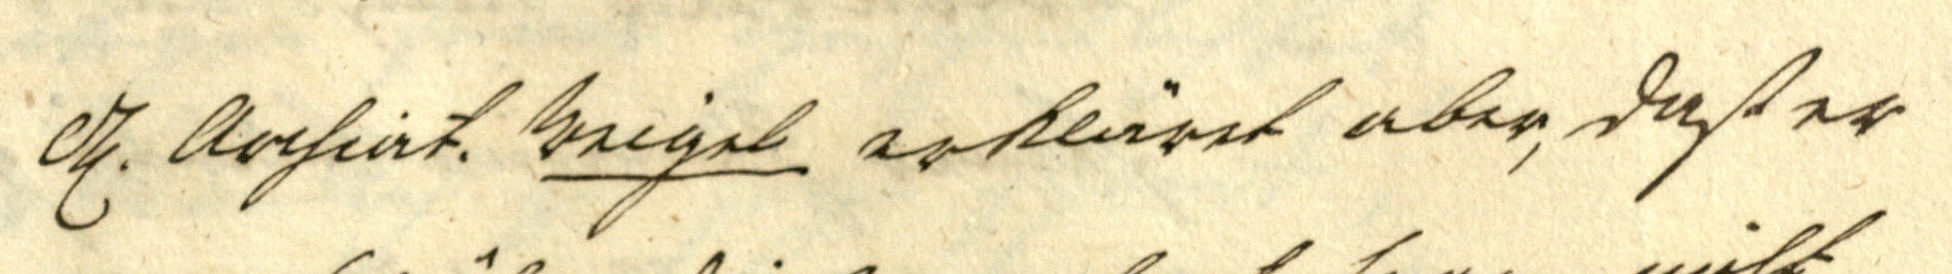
dh. Archiat. Weigel erkläret aber, daß er
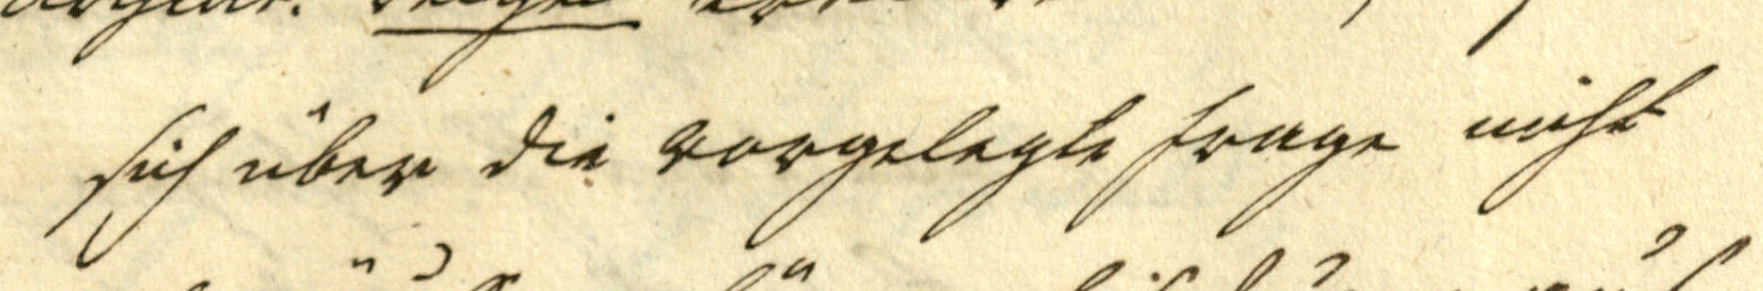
sich über die vorgelegte Frage nicht
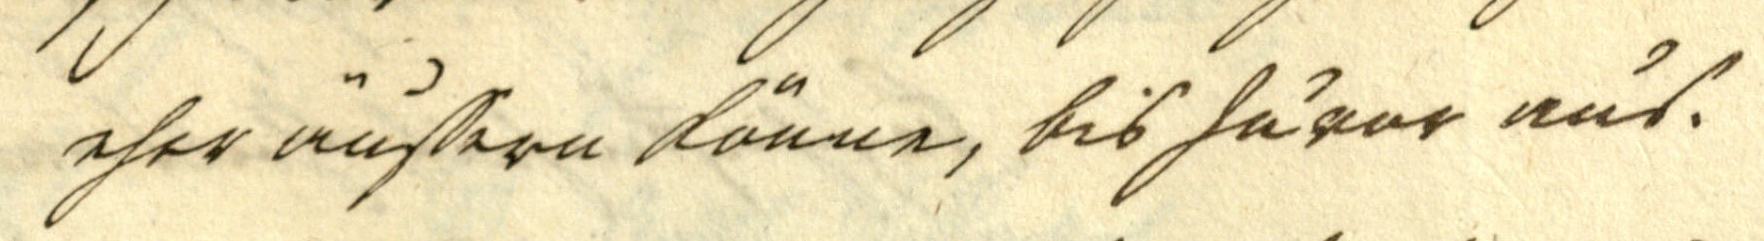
eher äussern könne, bis zuvor aus¬
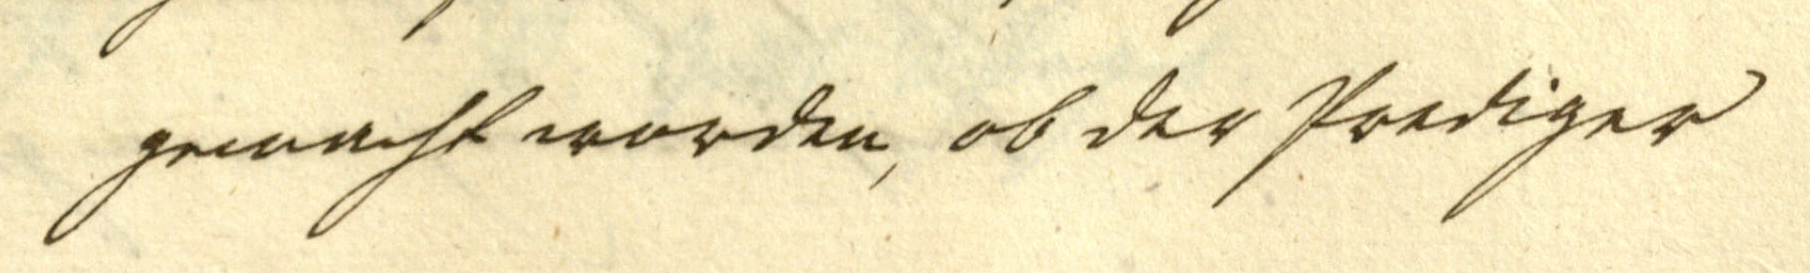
gemacht worden, ob der Prediger
